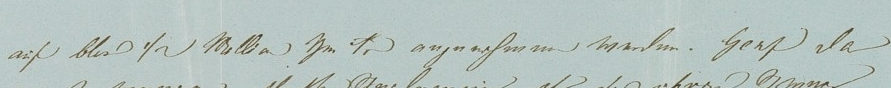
auf blos ½ Million Schw Fr angenohmen werden. Genf das
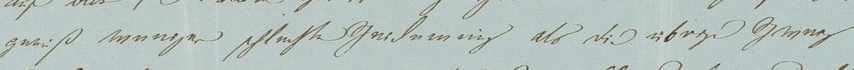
gewiß weniger schlechte Scheidemünz als die übrige Schweiz
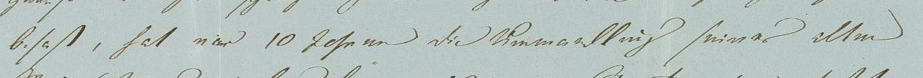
besaß, hat vor 10 Jahren die Umwandlung seines alten
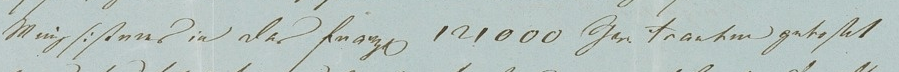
Münzsistems in das französische 121 000 Schw. Franken gekostet
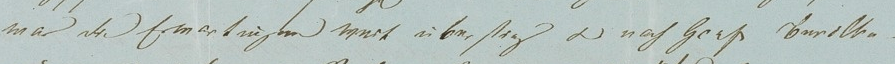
was die Erwartungen weit überstieg & nach Genfs Bevölke-
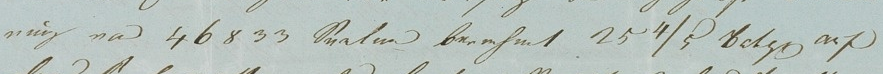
rung von 46 833 Seelen berechnet 25⅘ Batzen auf
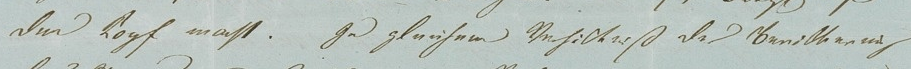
den Kopf macht. In gleichem Verhältniß der Bevölkerung
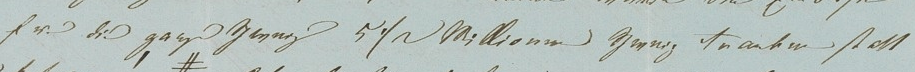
für die ganze Schweiz 5½ Millionen Schweiz Franken statt
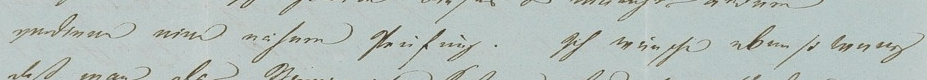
verdiene eine nähere Prüfung. Ich wünsche eben so wenig
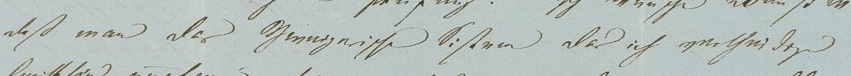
daß man das Schweizerische Sistem das ich vertheidige
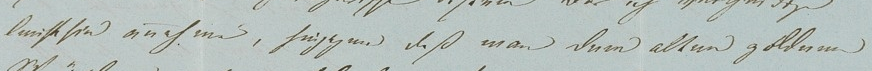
leichthin annehme, hingegen daß man dem alten goldnen
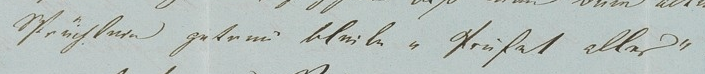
Sprüchlein getreu bleibe «Prüfet alles» –
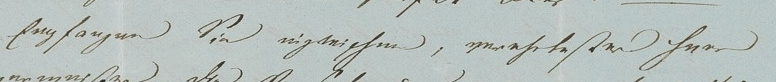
Empfangen Sie inzwischen, verehrtester Herr
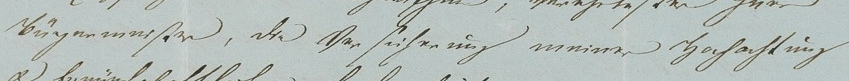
Bürgermeister, die Versicherung meiner Hochachtung
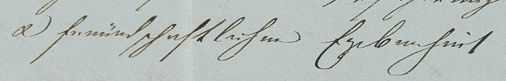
& freundschaftlicher Ergebenheit
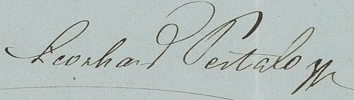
Leonhard Pestalozzi
